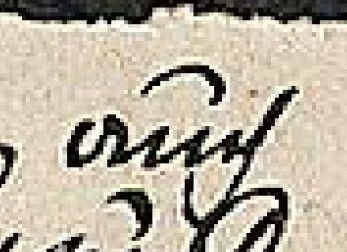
auch
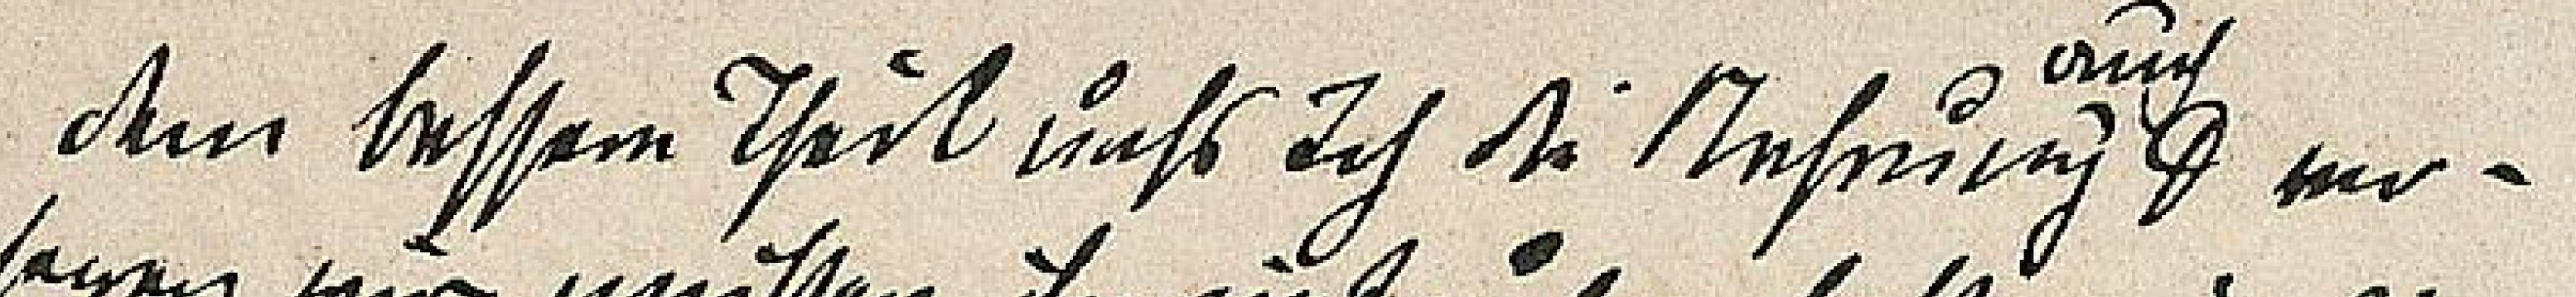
dem bessern Theil unss Ich die Nahrung o ver¬
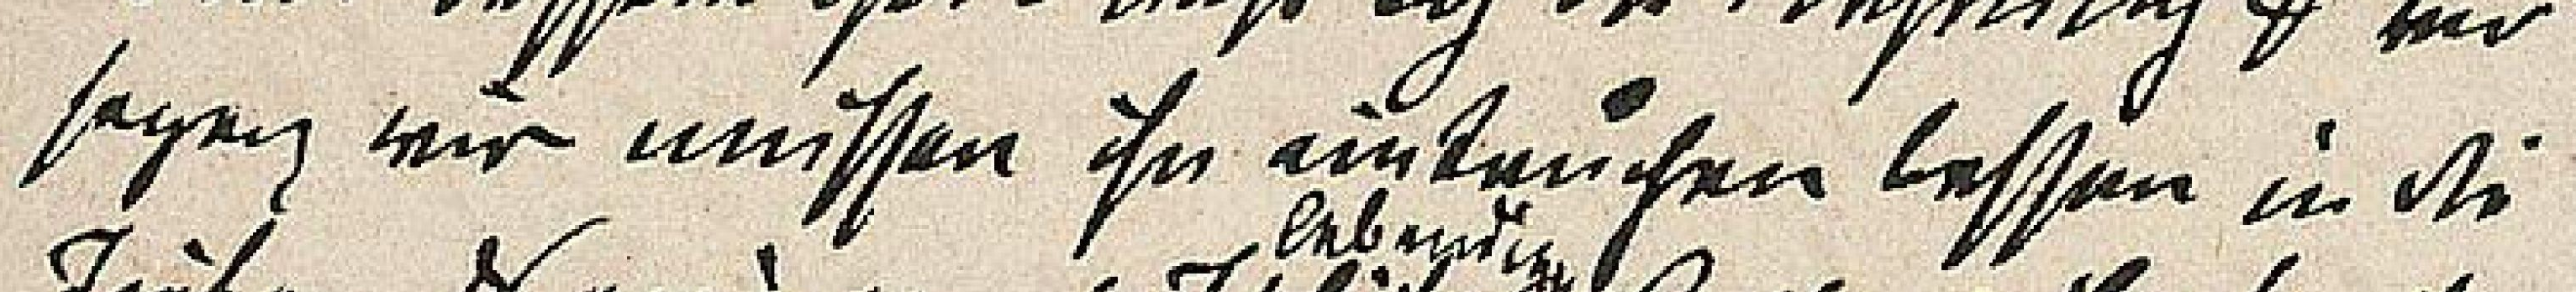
sagen, wir müssen ihn entauchen lassen in die
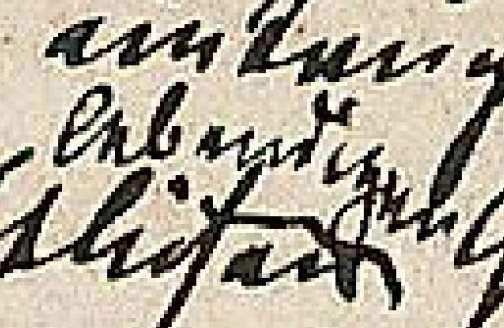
lebendigen
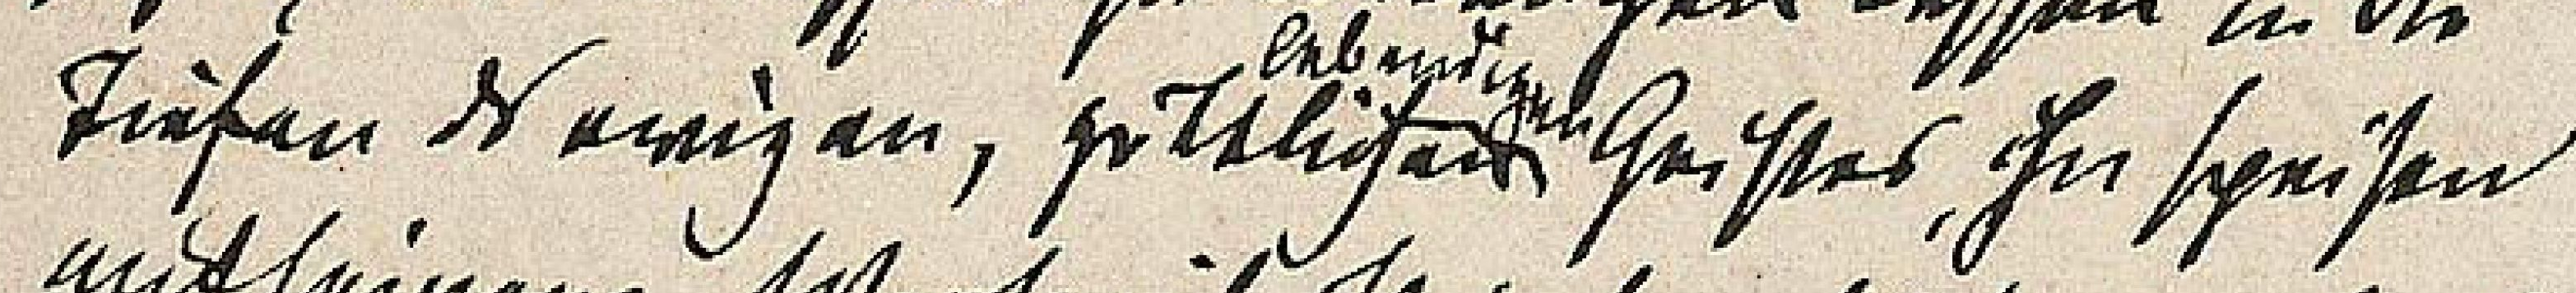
Tiefen ds ewigen, göttlichen Geistes ihn speisen
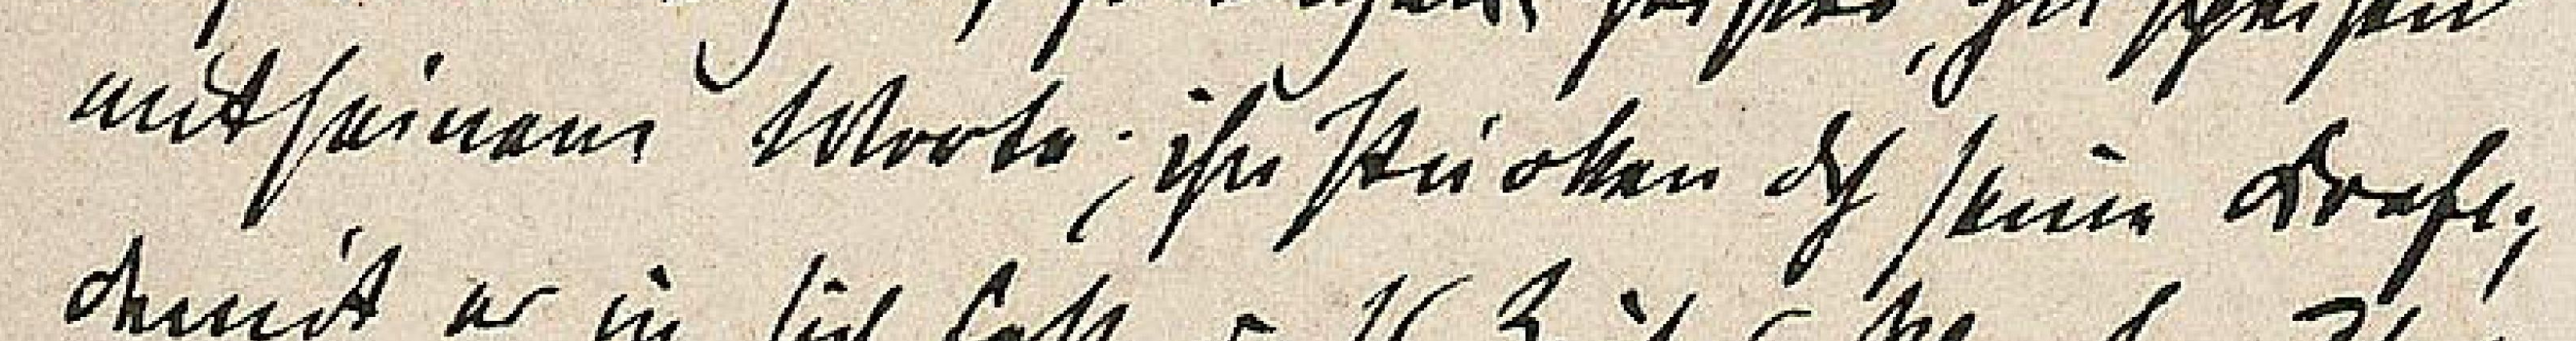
mit seinem Worte; ihn stärken doch seine Kraft,
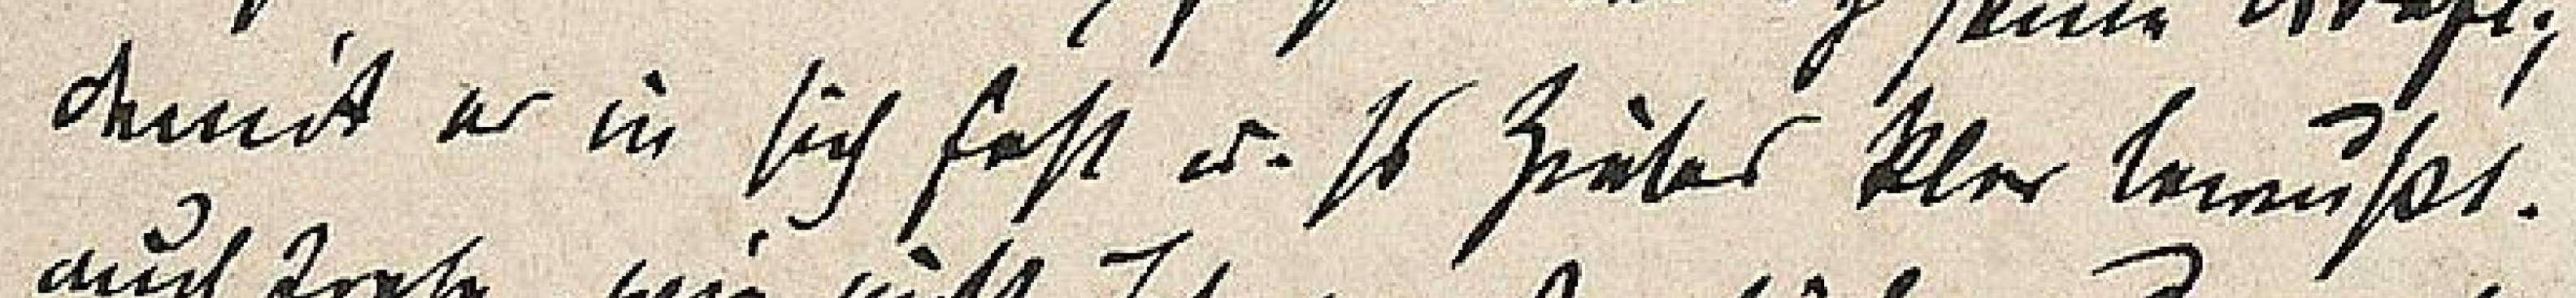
damit er in sich fest u. ss Zieles klar bewußt.
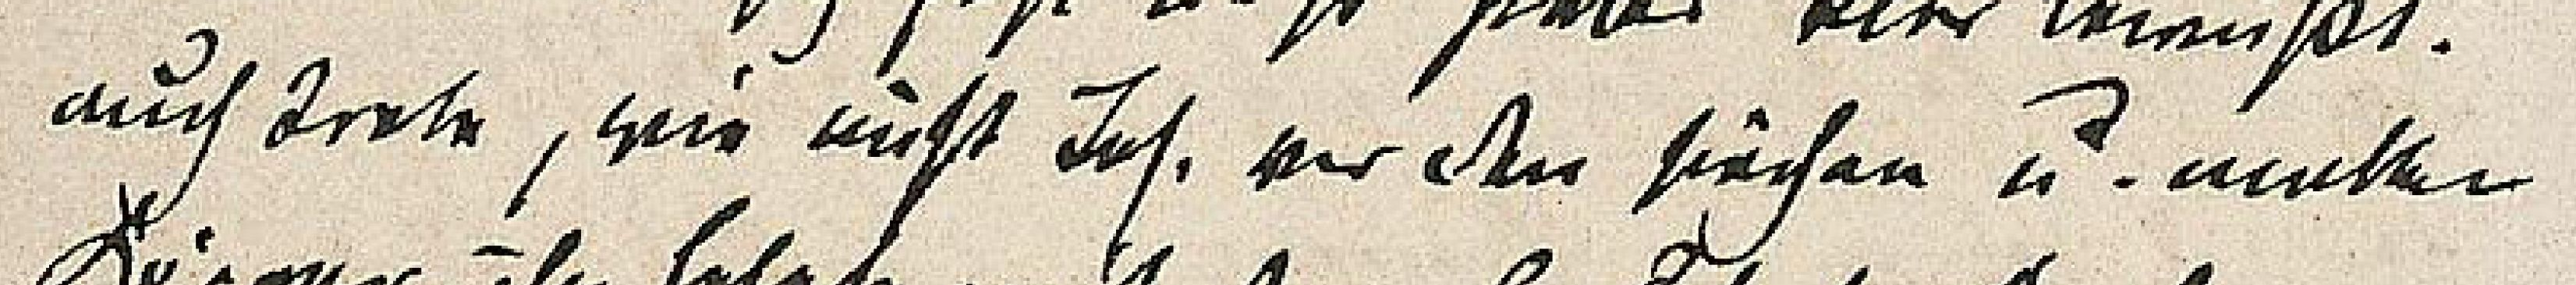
auchtrete, wie nicht Jes. vor den siechen u. nackten
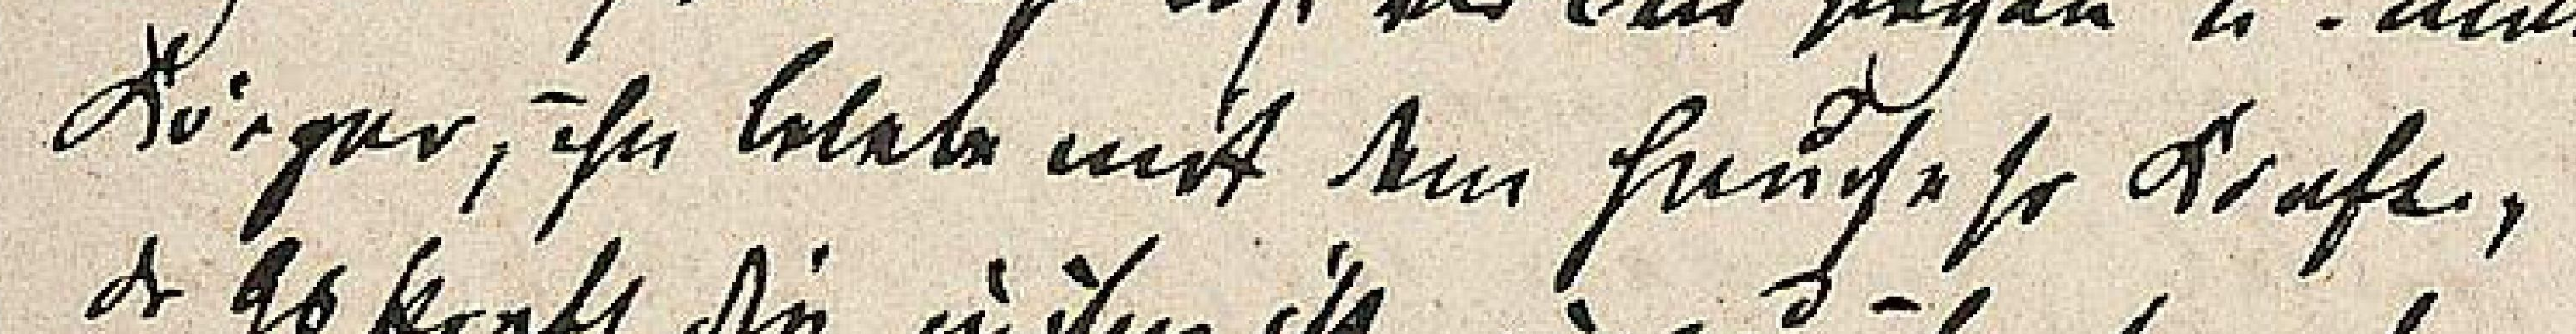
Körper, ihn belebte mit dem Hauche sr. Kraft,
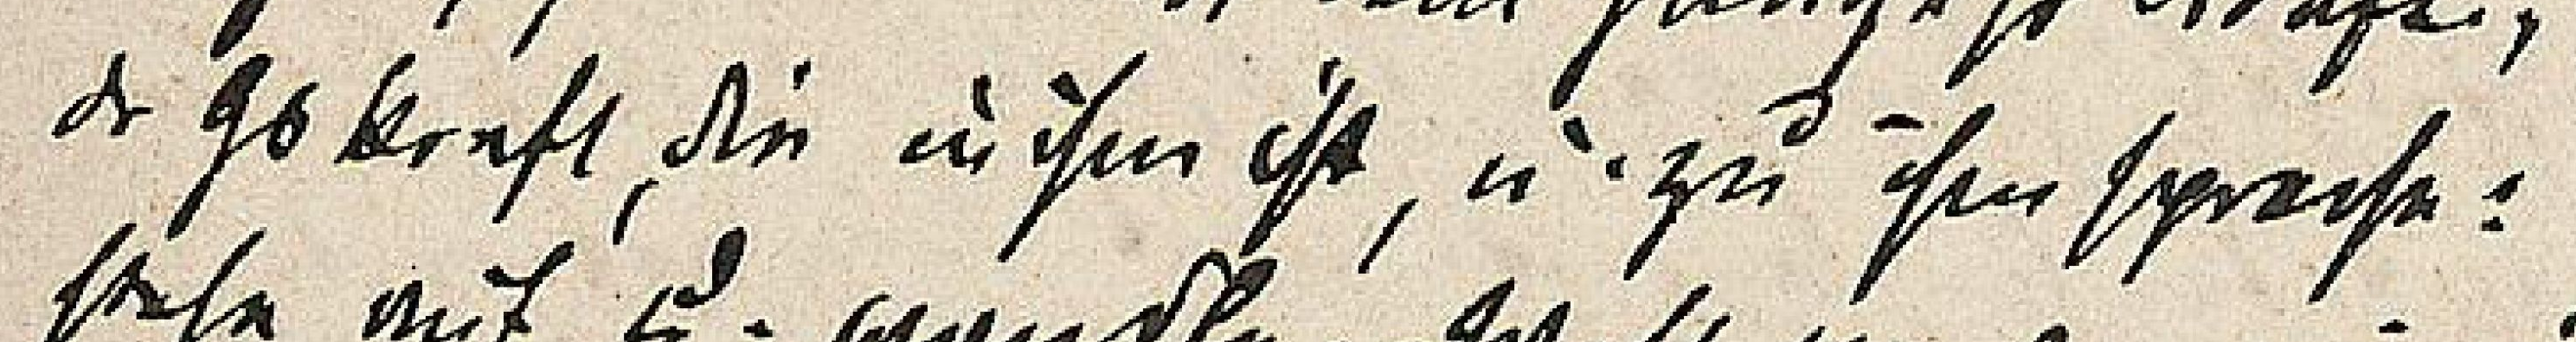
der Gskraft, die in ihm ist, u. zu ihm spreche:
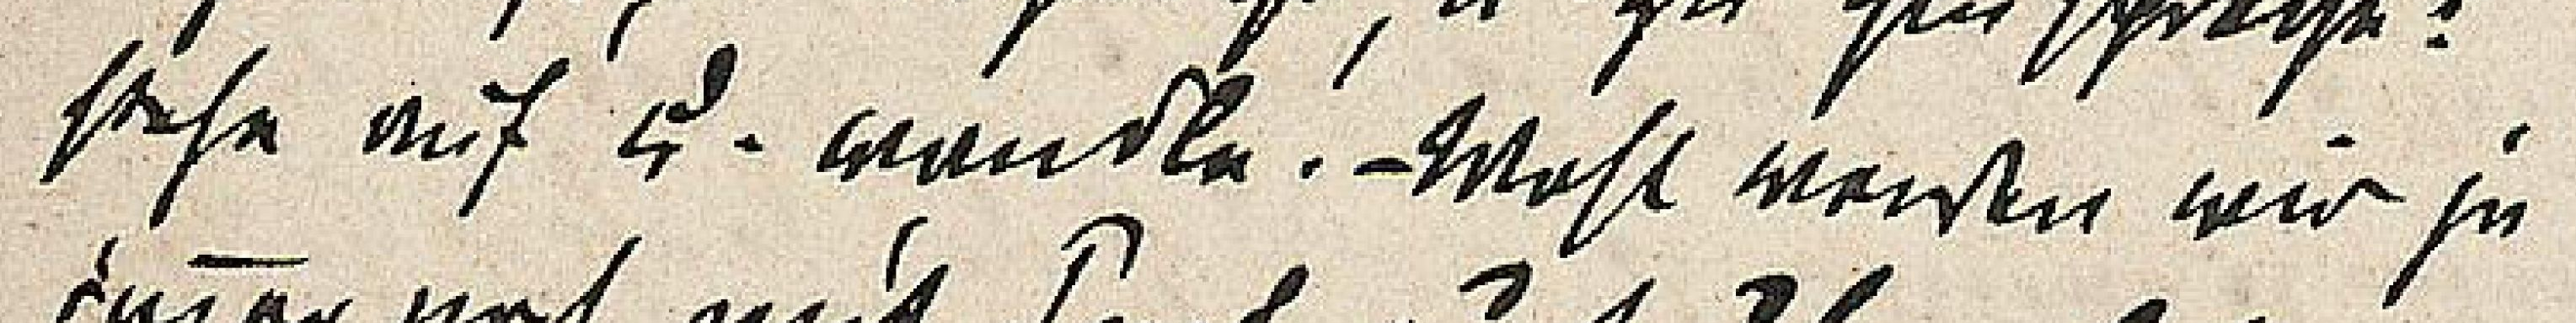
stehe auf u. wandle. _ Wohl werden wir ja
